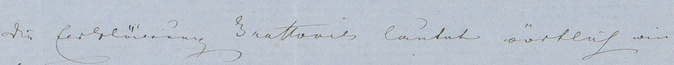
Die Erklärung Grattonis lautet wörtlich wie
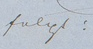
folgt:
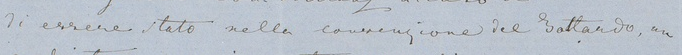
die essere stato nella convenzione del Gottardo, un
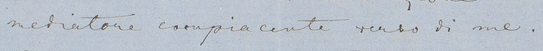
mediatore compiacente verso di me.
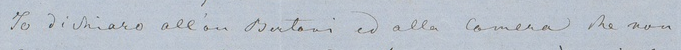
Io dichiaro all'on. Bertani ed alla Camera che non
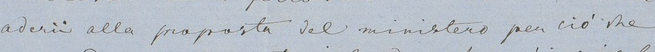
aderi alla proposta del ministero per ciò che
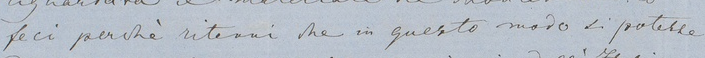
feci perchè ritorni che in questo modo si potesse
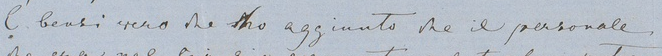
È bensi vero che ho aggiunto che il personale
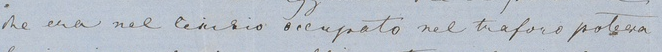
che era nel Cenisio occupato nel traforo potera
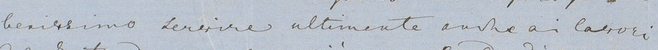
benissimo servire ultimente anche ai lavori
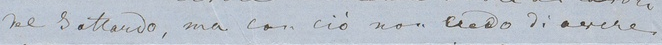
del Gottardo, ma con ciò non credo di avere
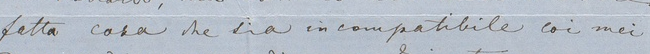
fatta casa che sia incompatibile coi mei
